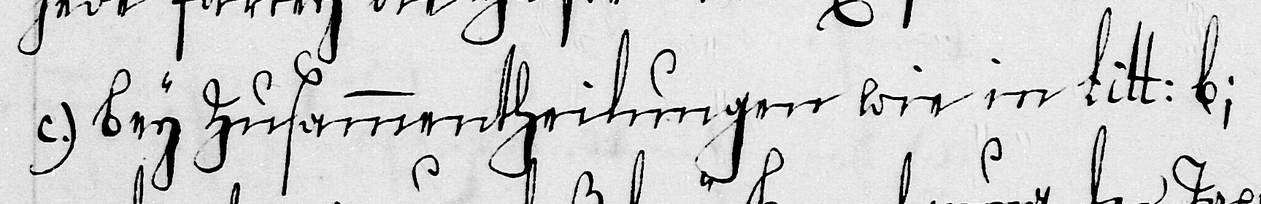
c.) Bey Zusammentheilungen wie in Litt: b;
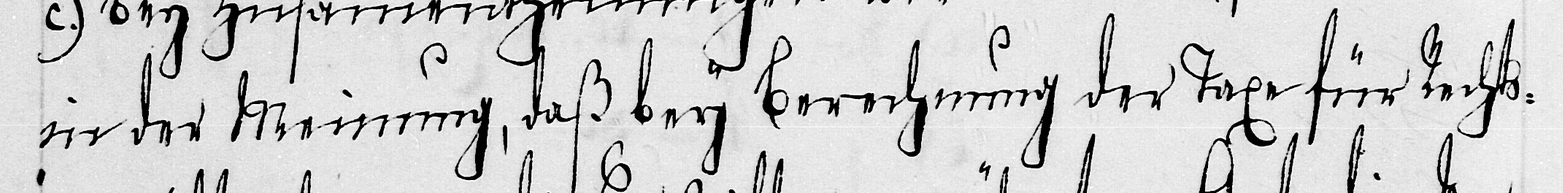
in der Meinung, daß bey Berechnung der Taxe für Rechts¬
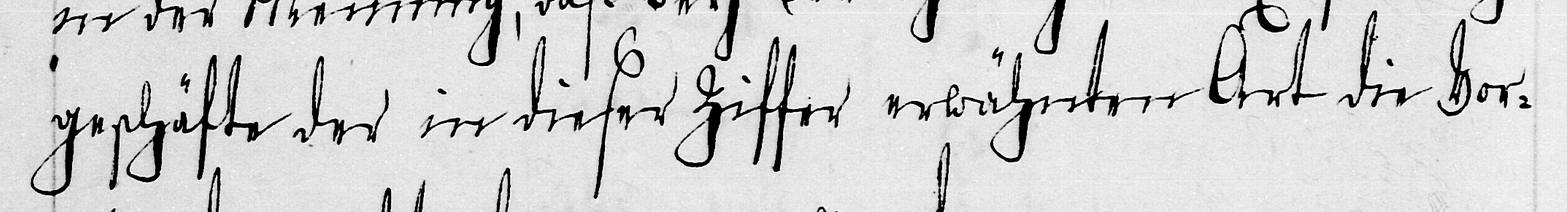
geschäfte der in dieser Ziffer erwähnten Art die Vor¬
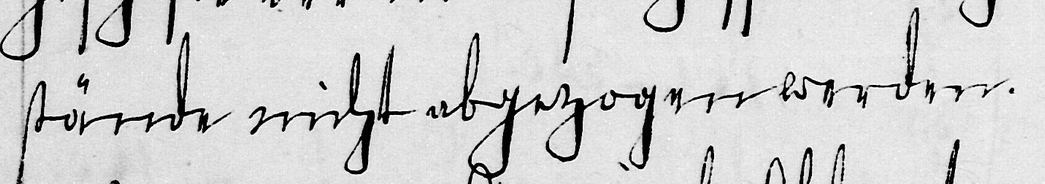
stände nicht abgezogen werden.
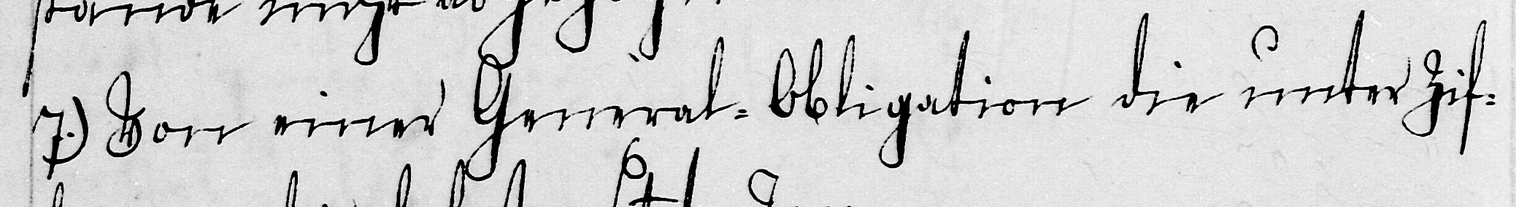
7.) Von einer General-Obligation die unter Zif¬
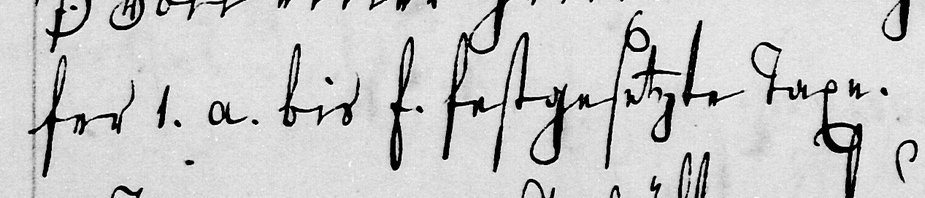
fer 1. a. bis f. festgesetzte Taxe.
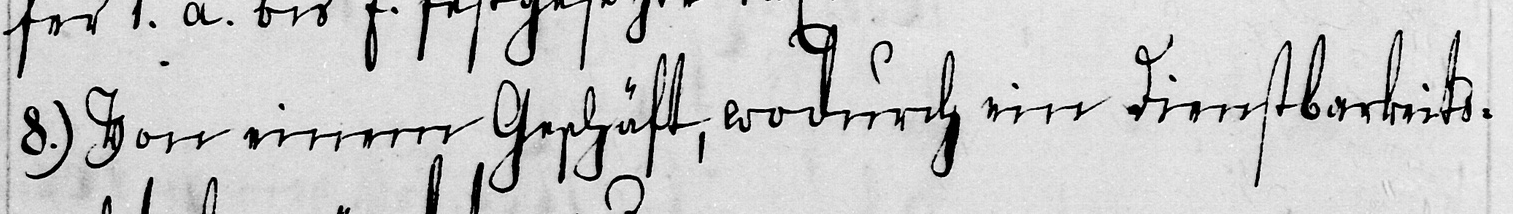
8.) Von einem Geschäft, wodurch ein Dienstbarkeits¬
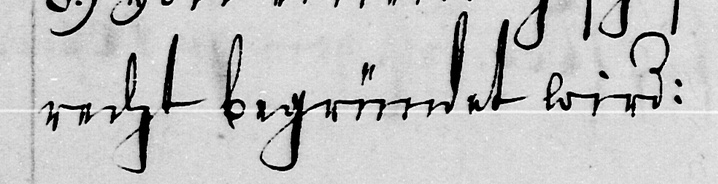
recht begründet wird:
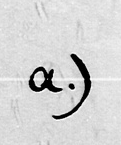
g.)
